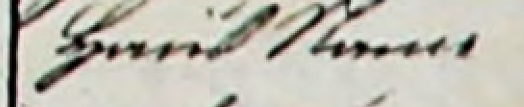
Haus Name
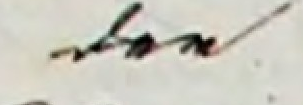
der
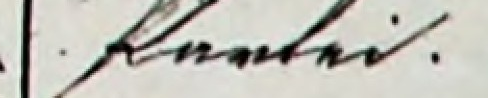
Partei.
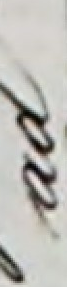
ad
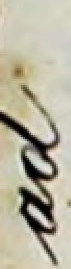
ad
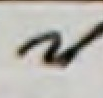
J.
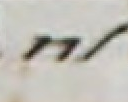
K.
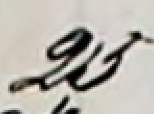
25
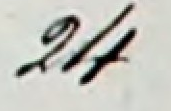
24
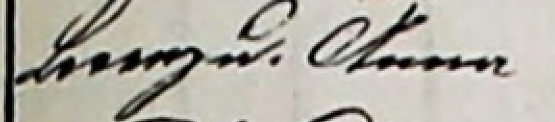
Lorenz u. Anna
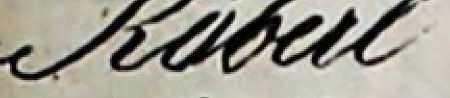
Köberl
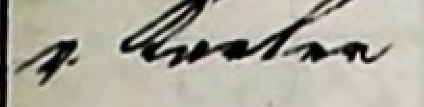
v. Kroler
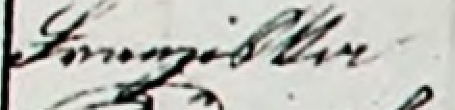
Franziska
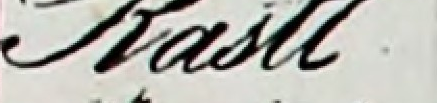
Rastl
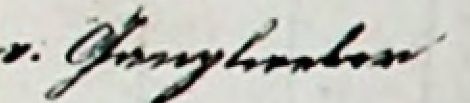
v. Ganzlweber
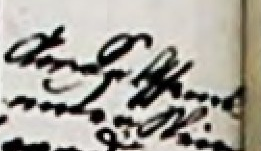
An ???
